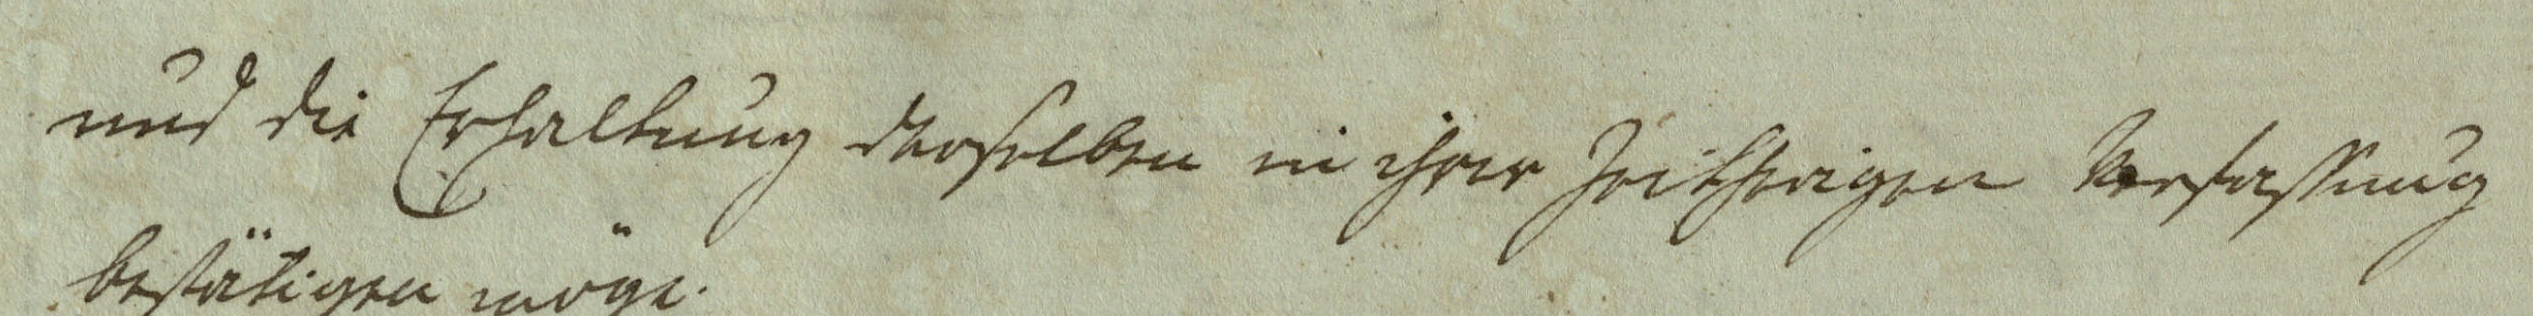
und die Erhaltung derselben in ihrer zeithagen Verfassung
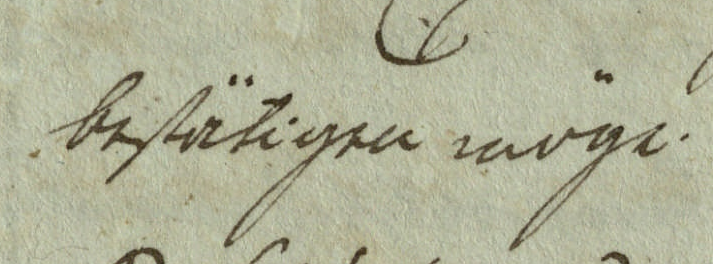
bestätigen möge
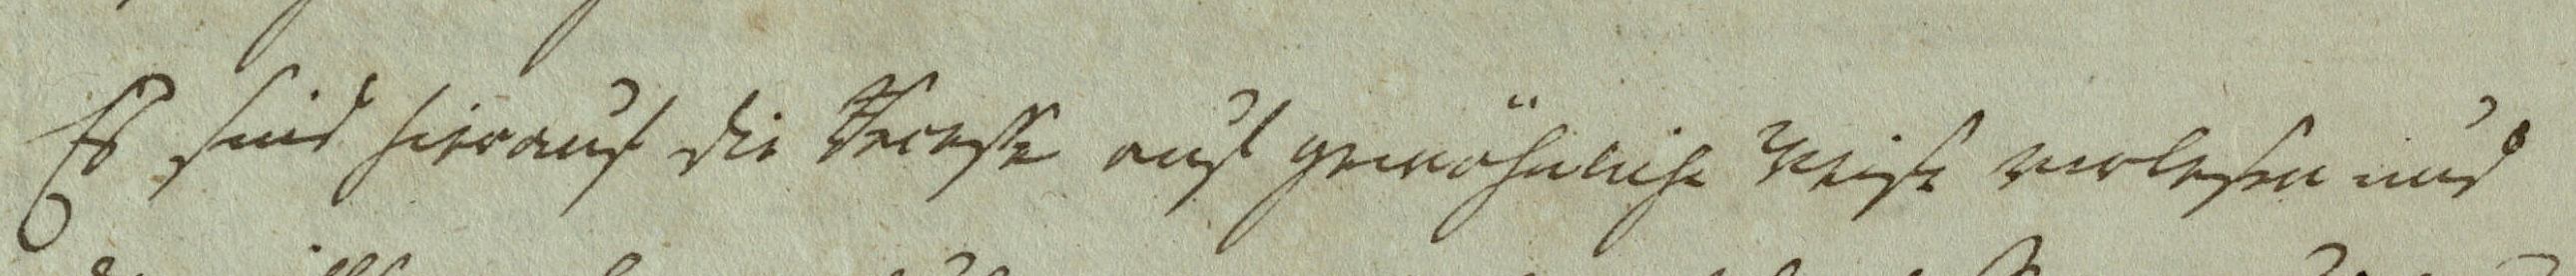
Es sind hierauf die Receste auf gewnohnliche Weise verlesen und
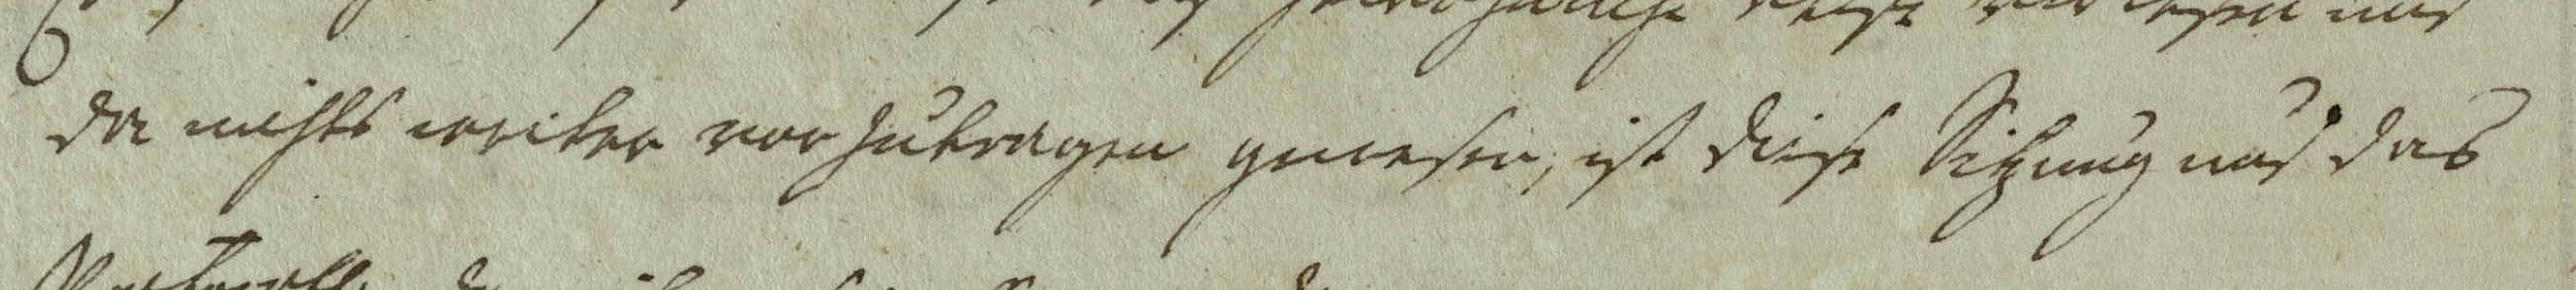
da nichts weiter vorzutragen gewesen, ist diese Sitzung und das
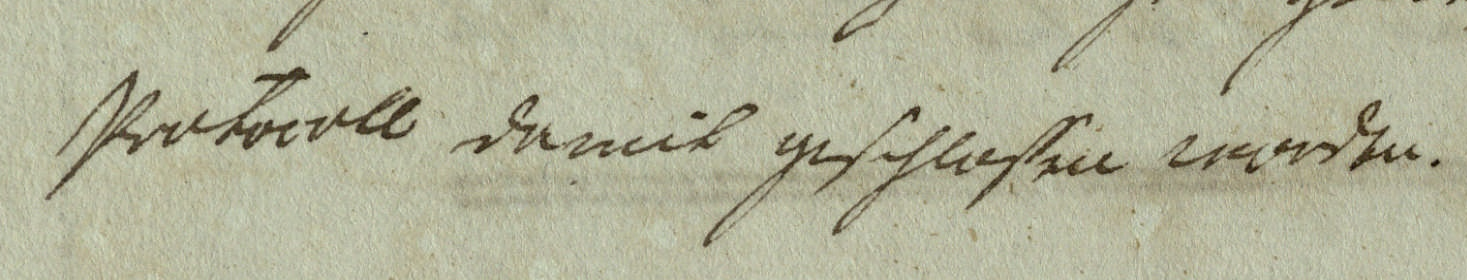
Protocoll damit geschlossen worden.
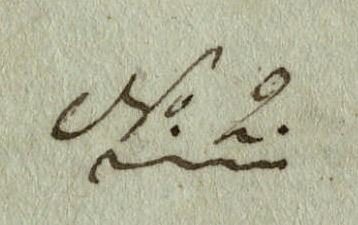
No.
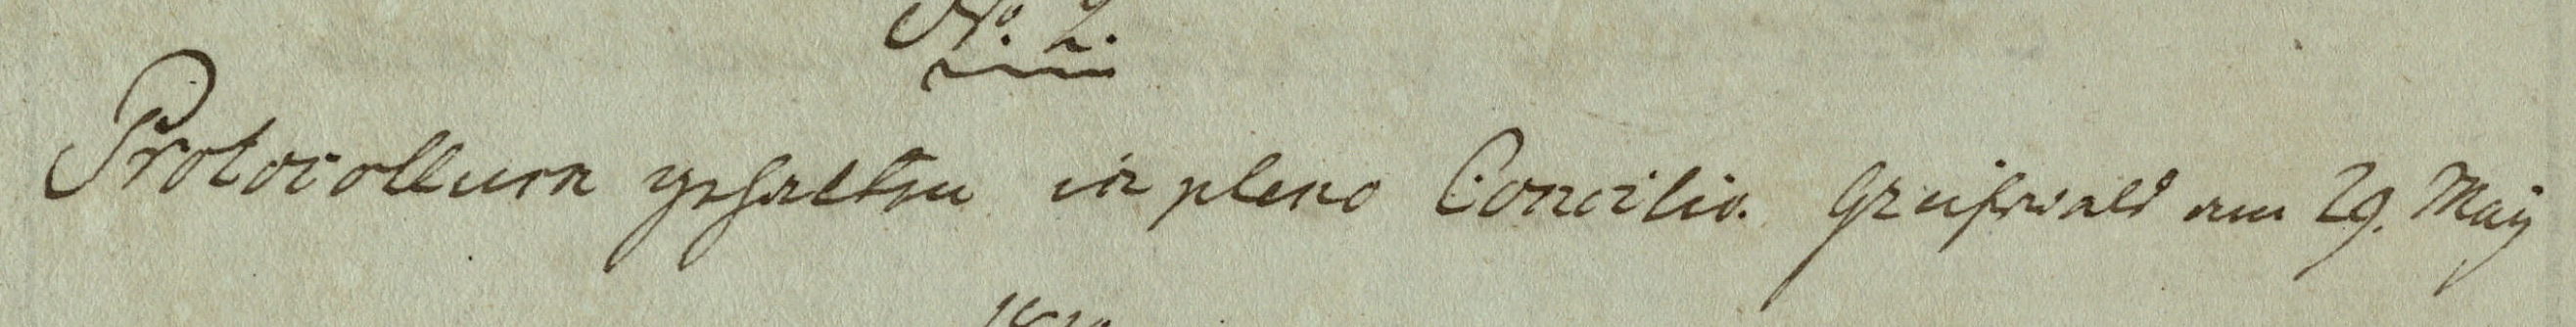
Protocollum gehalten in pleno Concilio Greifswald am 29. Maÿ
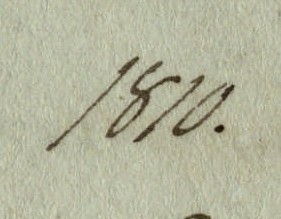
so.
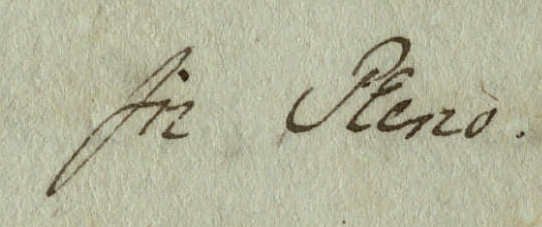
In Pleno
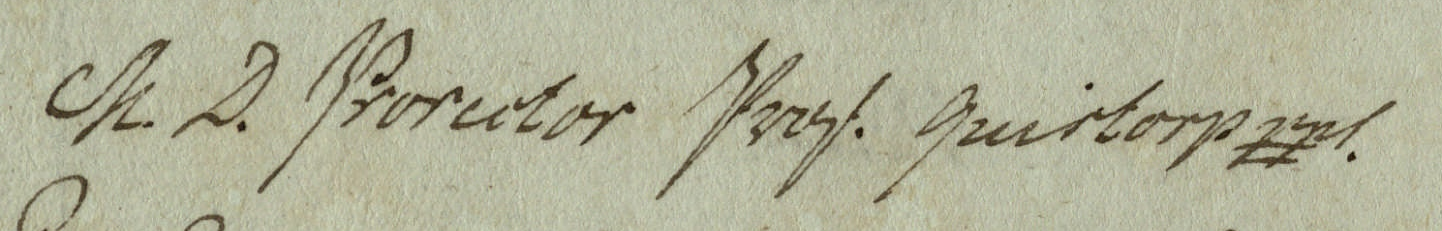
M. D. Prorector Prof. Quistorp.
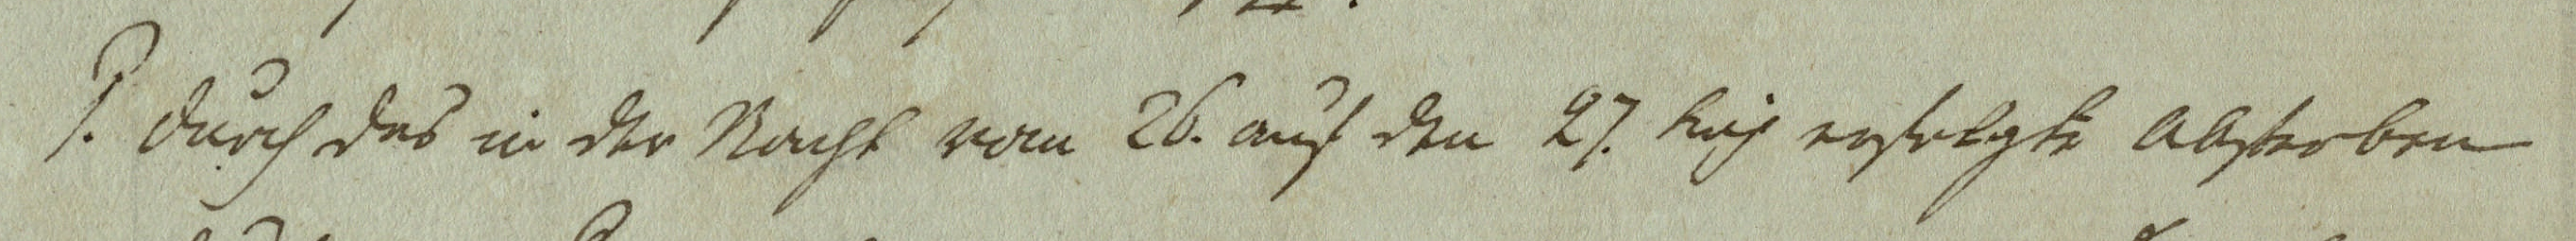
7. Durch des in der Nacht von 26 auf dem 27. huj erfolgten Absterben
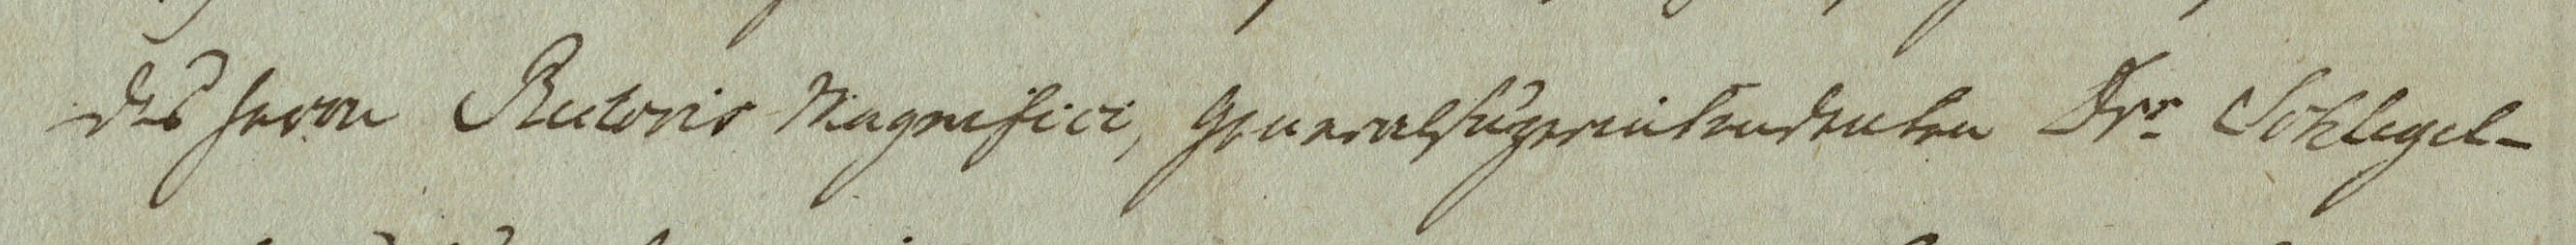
des herrn Rectoris Magnifice, Gweratsugprintendenten Sr Schlegel.
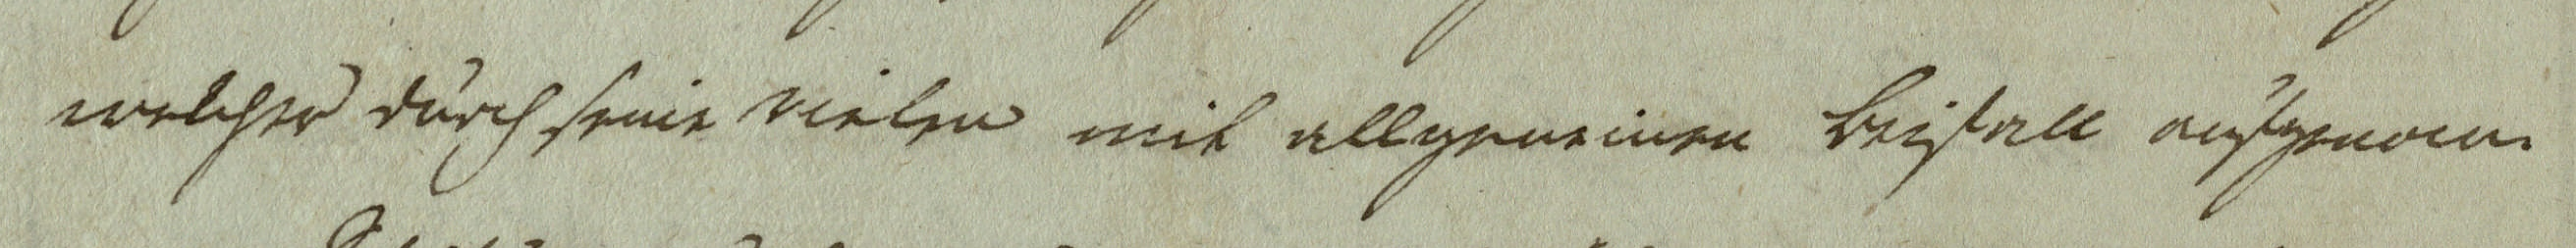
welcher durch seine vielen mit allgemeinen Beifall aufgenön¬
